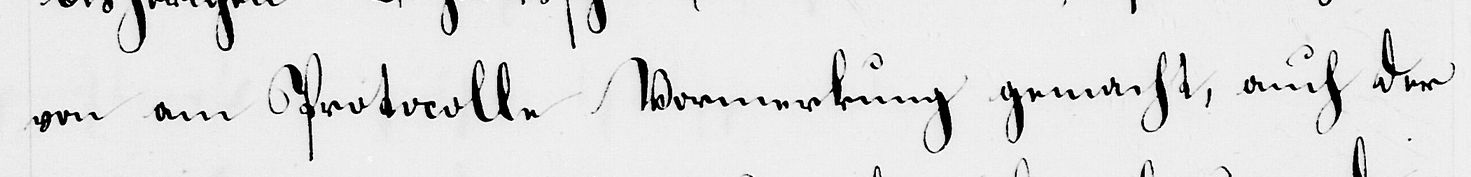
von am Protocolle Vormerkung gemacht, auch der
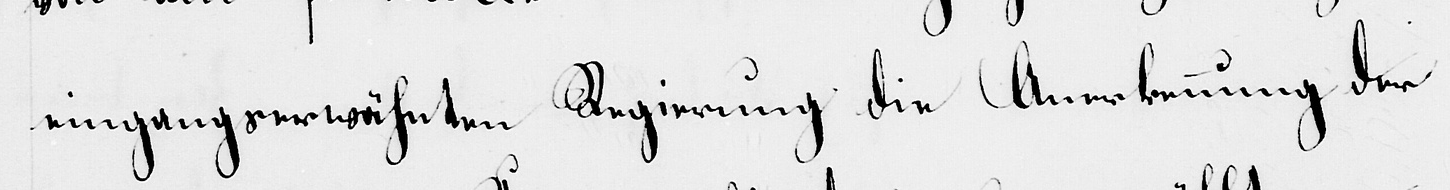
eingangserwähnten Regierung die Anerkennung der
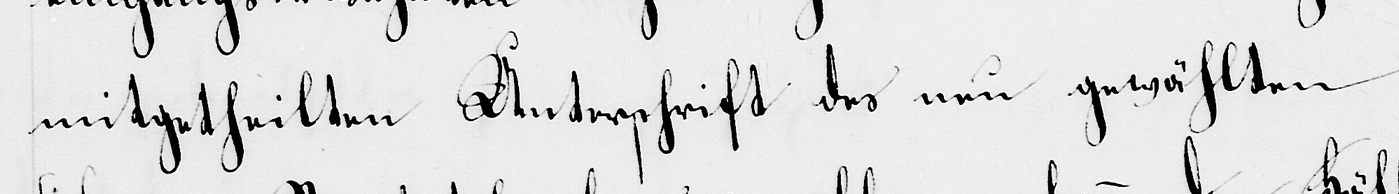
mitgetheilten Unterschrift des neu gewählten
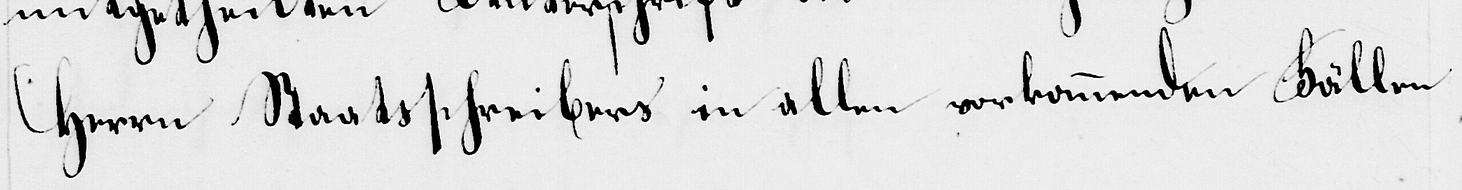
Herrn Staatschreibers in allen vorkommenden Fällen
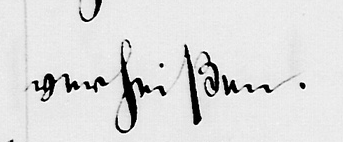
verheißen.
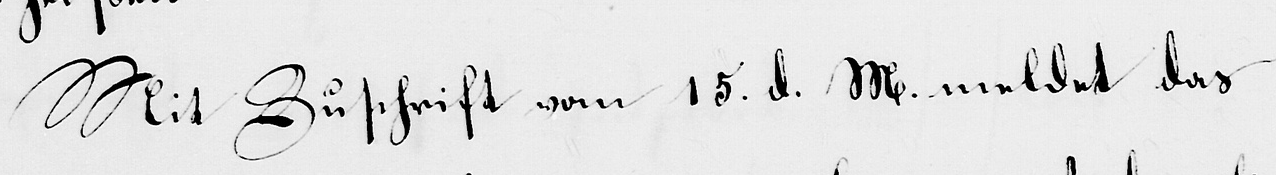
Mit Zuschrift vom 15. d. M. meldet das
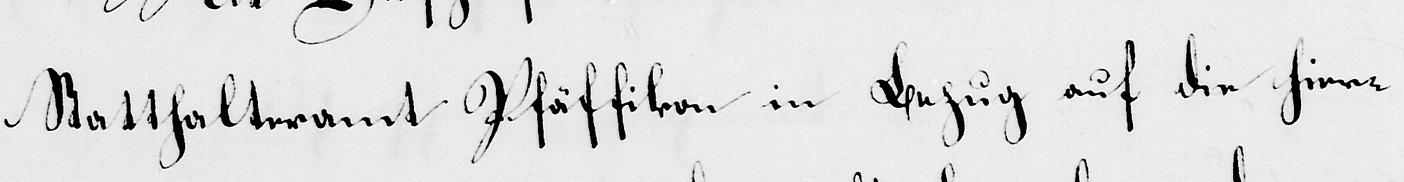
Statthalteramt Pfäffikon in Bezug auf die hier¬
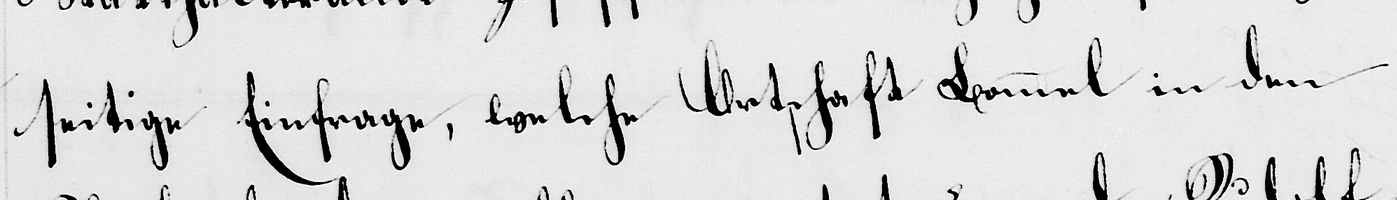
seitige Einfrage, welche Ortschaft Bommel in den
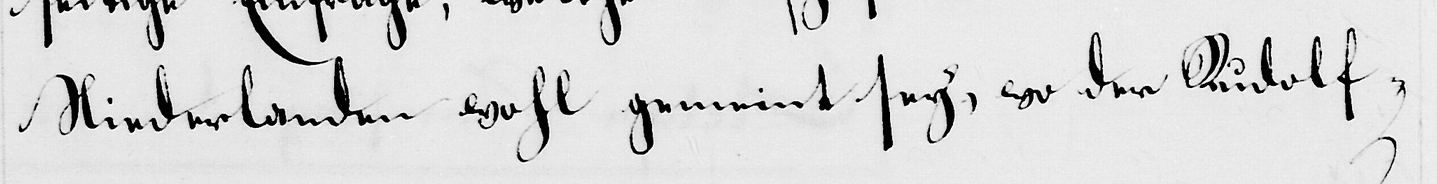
Niederlanden wohl gemeint sey, wo der Rudolf
